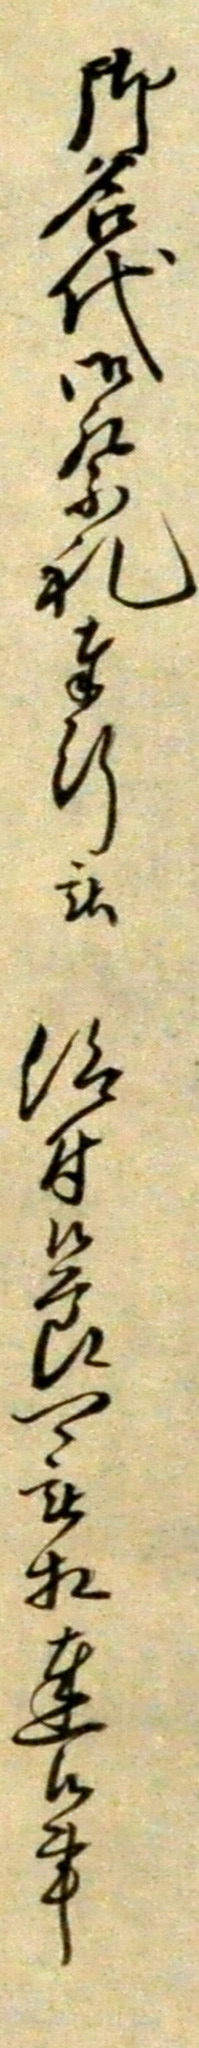御名代御祭禮奉行被仰付候節可被相達候事
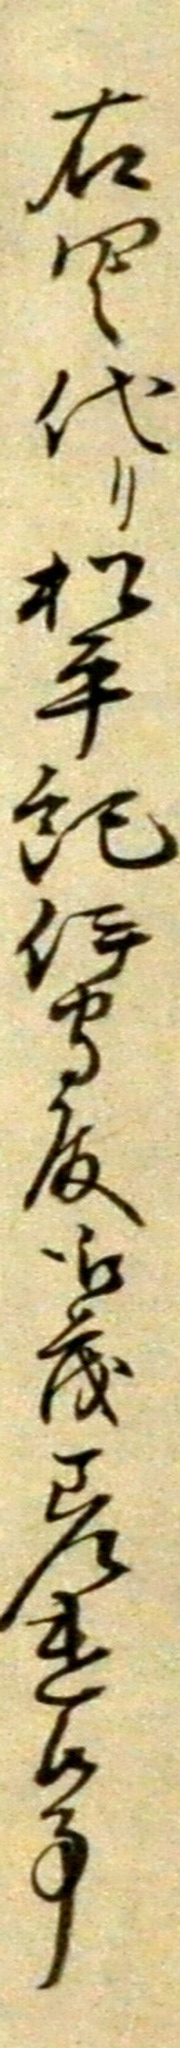右写代り松平紀伊守殿江茂差遣候事
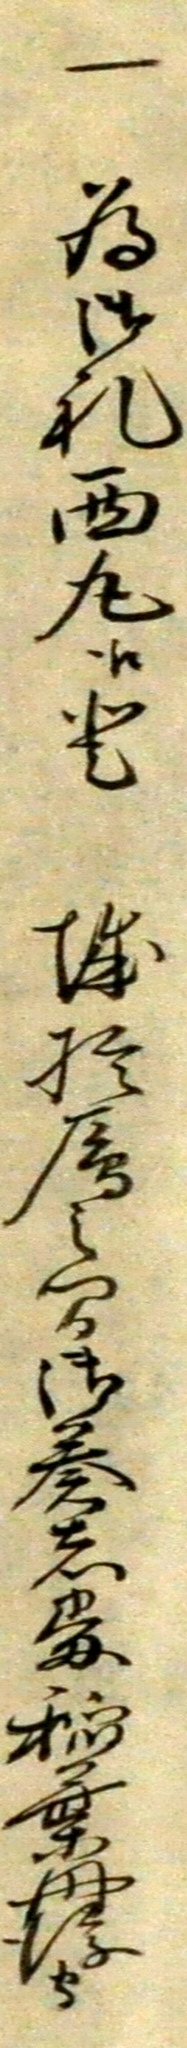一為御礼西丸江登城於雁ノ間御奏者稲葉丹後守
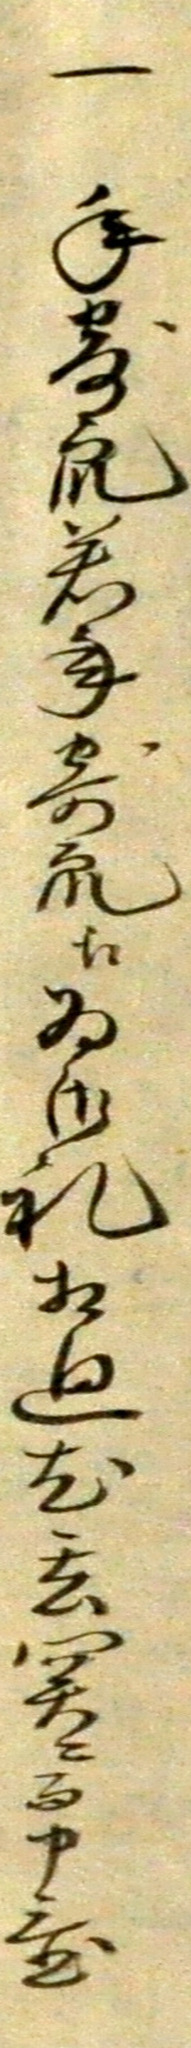一年寄衆若年寄衆江為御礼相廻尤玄関ニ而申置
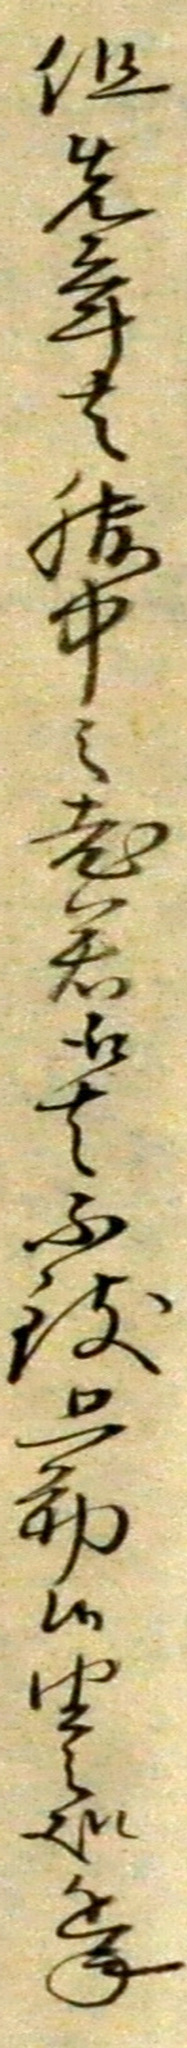但先年者服中之老若江者不致廻勤候由之処近申
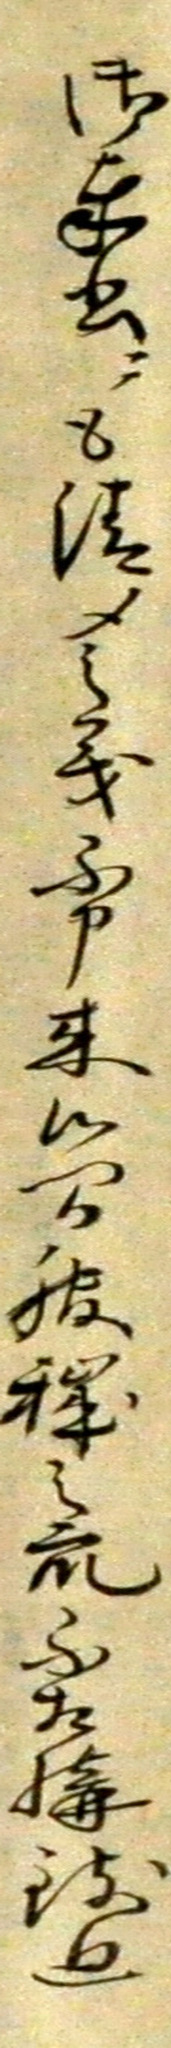御奉公ニも清メ之義不申来候間服釋之衆不相構致廻
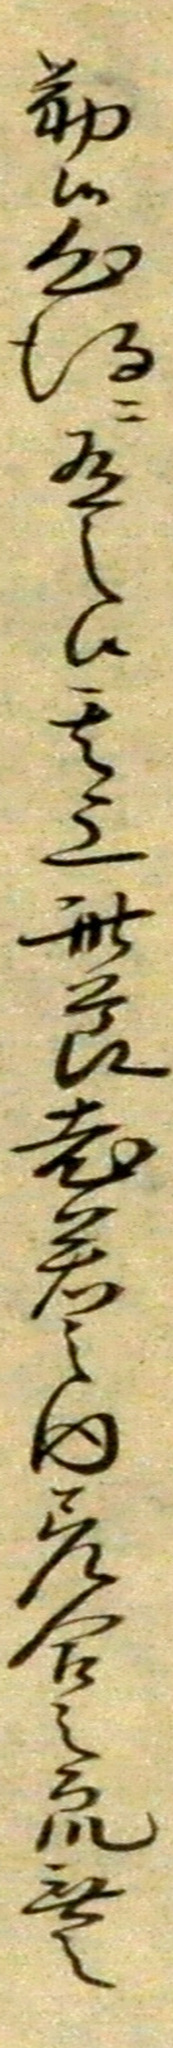勤候心得ニ有之候其此節老若之内差合之衆無之
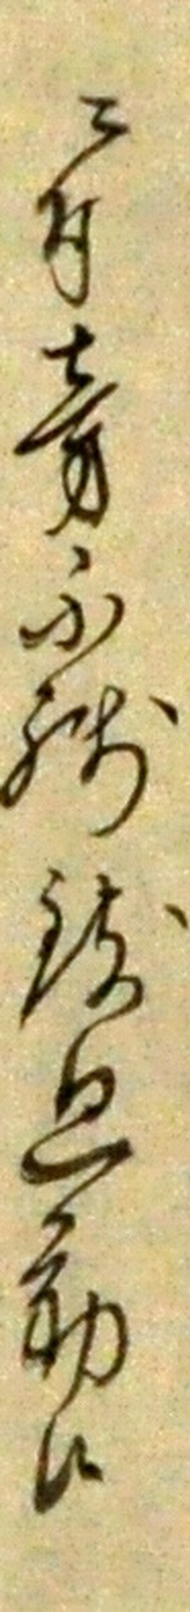二付旁不残致廻勤候
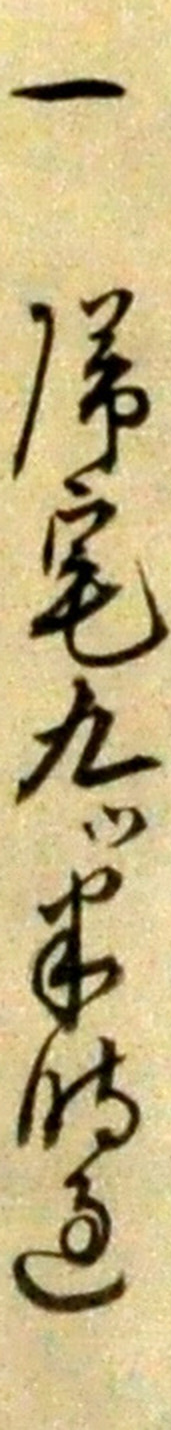一帰宅九ッ半時過
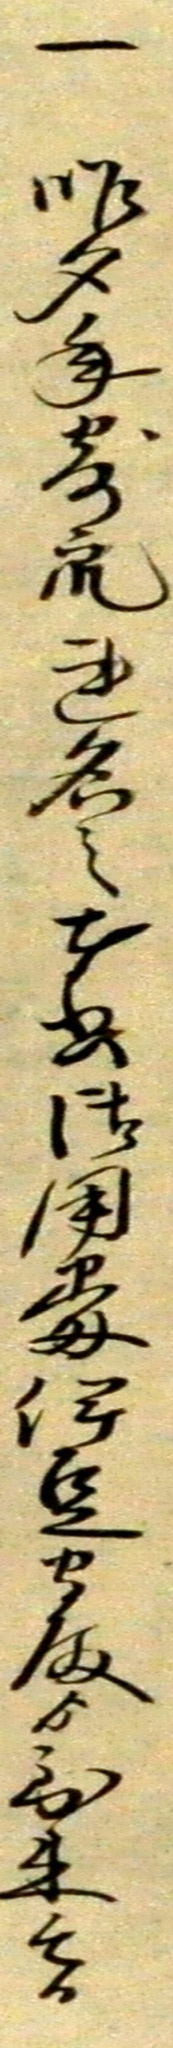一昨夕年寄衆連名之奉書御用番伊豆守殿守殿ゟ到来今日
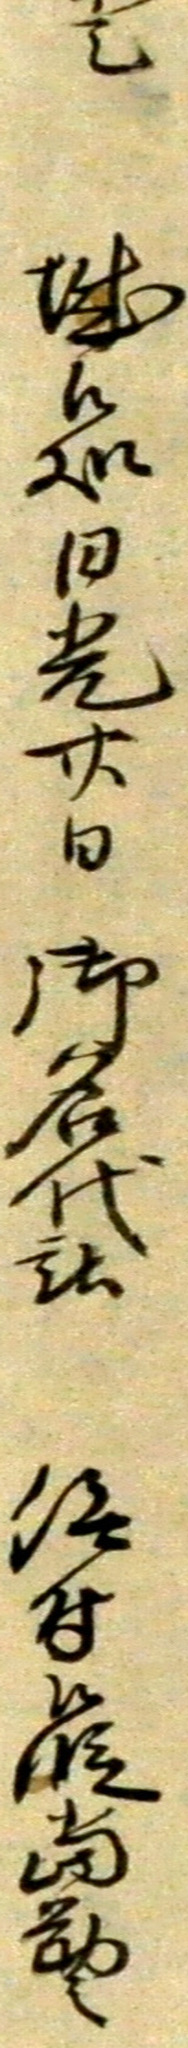登城候処日光廿日御名代被仰付候段當勤之
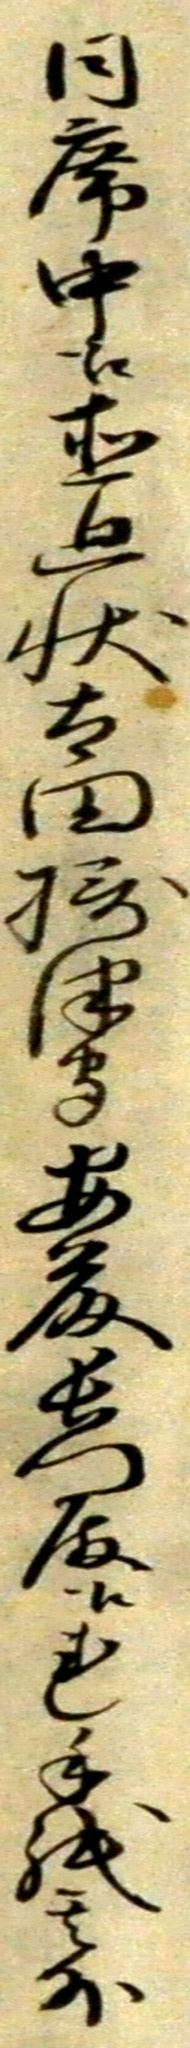同席中江直廻状太田攝津守安藤長門殿江も手紙其外
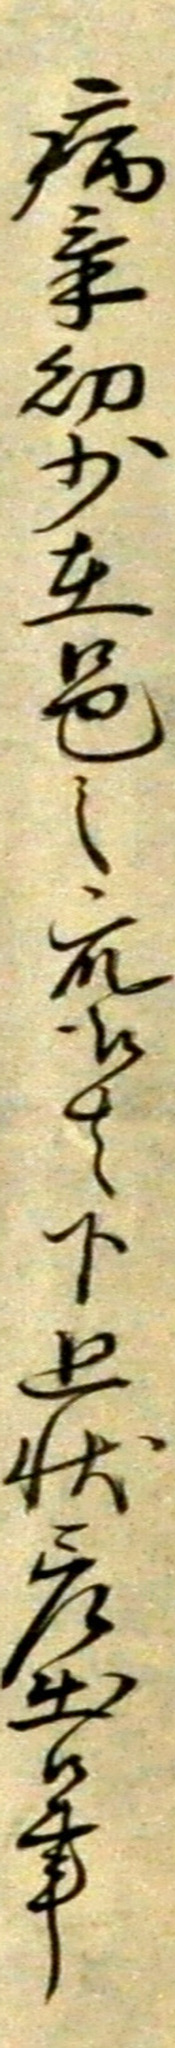病気幼少在邑之衆江者下廻状差出候事
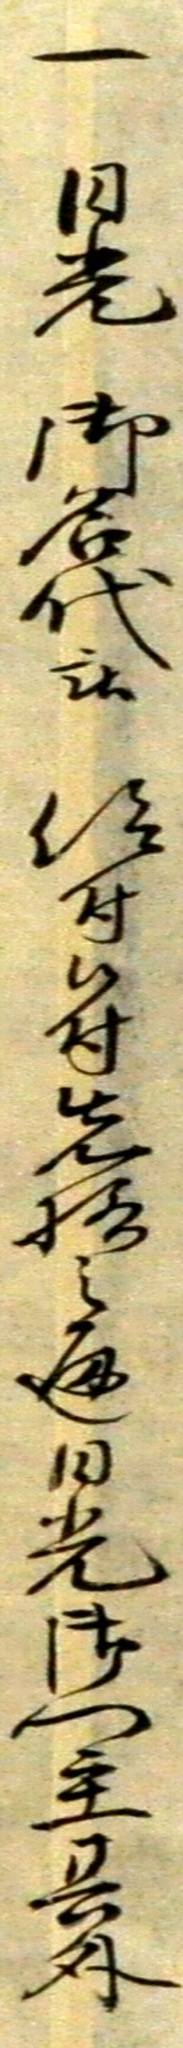一日光御名代被仰付候付先格之通日光御門主其外
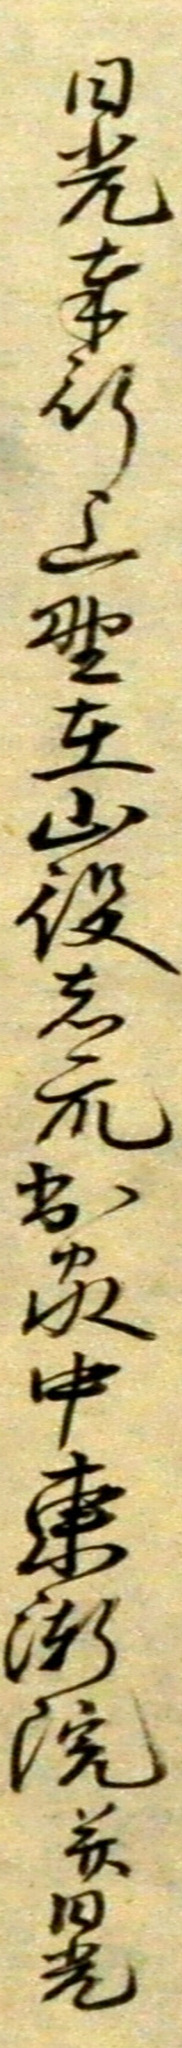日光奉行上野在山役者衆出家中東漸院幷日光
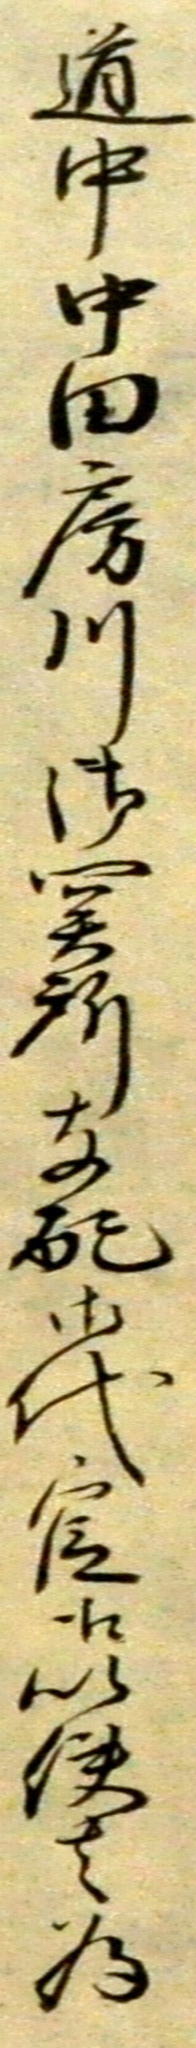道中中田房川御関所支配御代官江以使者為
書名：日光御名代相勤候節ノ留
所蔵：伊那市立高遠町図書館・合同会社AMANE
